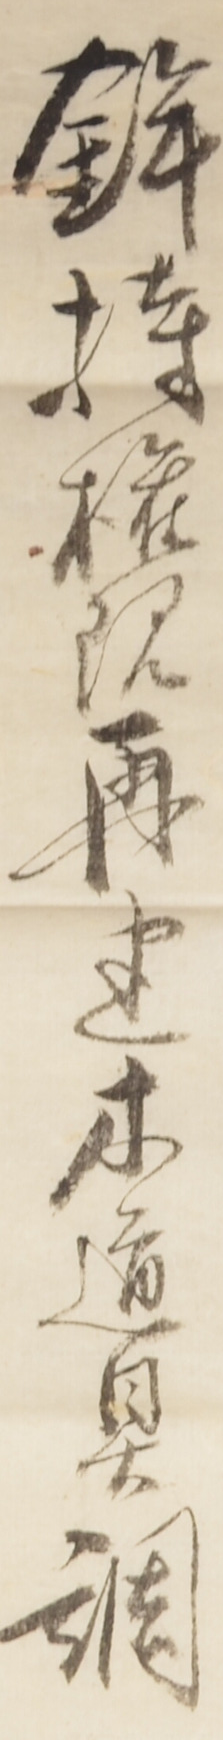鉾持権現再建木道具調
